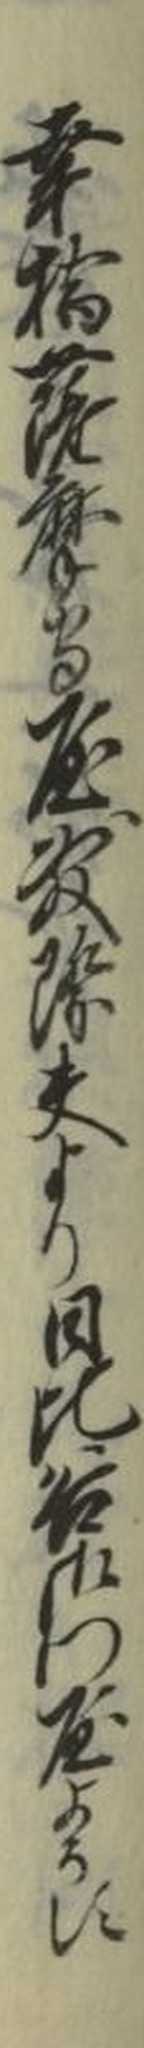幸橋薩摩守屋敷際夫より日比谷御門屋よろす
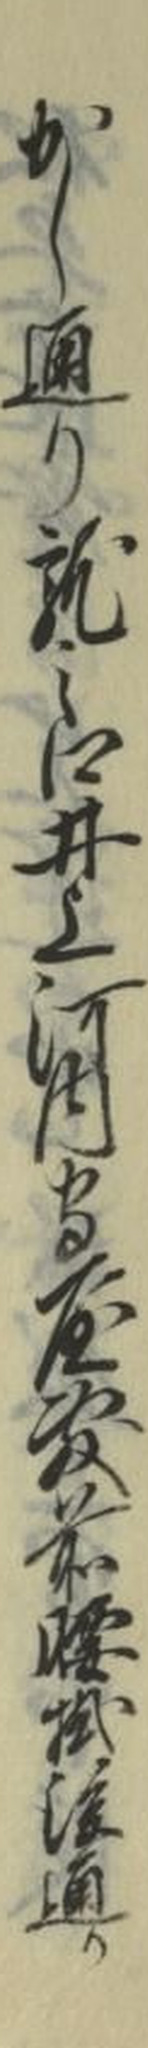かし通り龍之口井上河内守屋敷前腰掛後通り
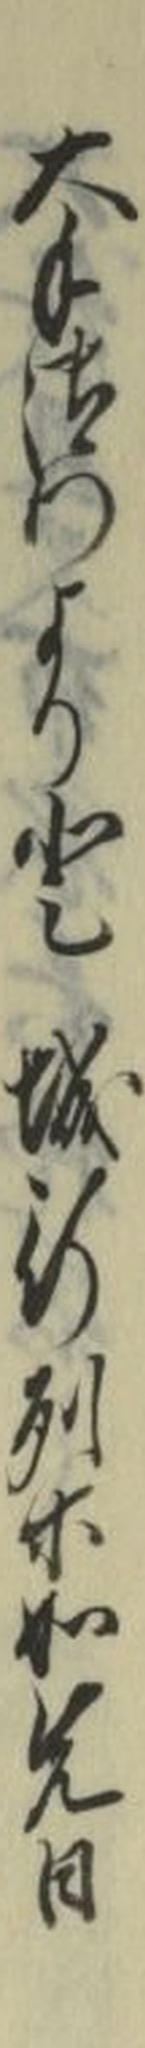大手御門より登城行列等如先日
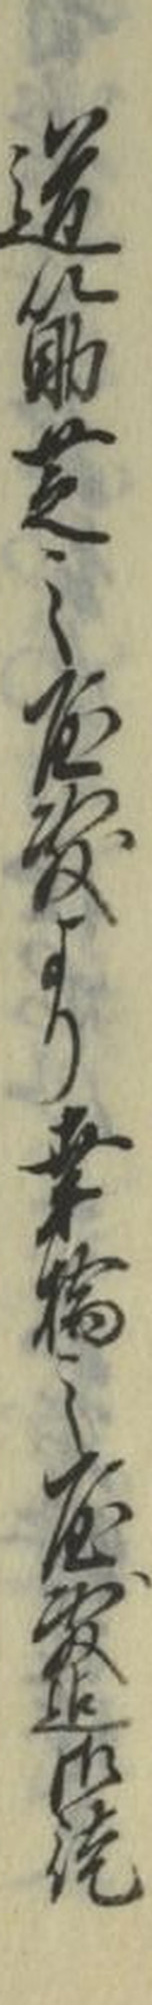道筋芝之屋敷より幸橋之屋敷迄御徒
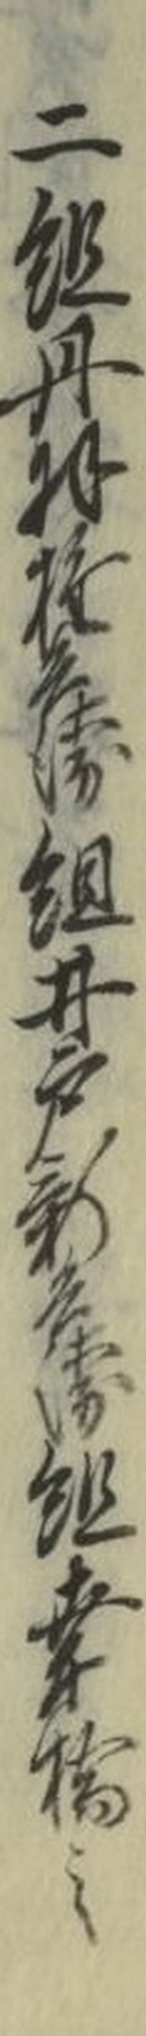二組丹羽権兵衛組井戸新兵衛組幸橋之
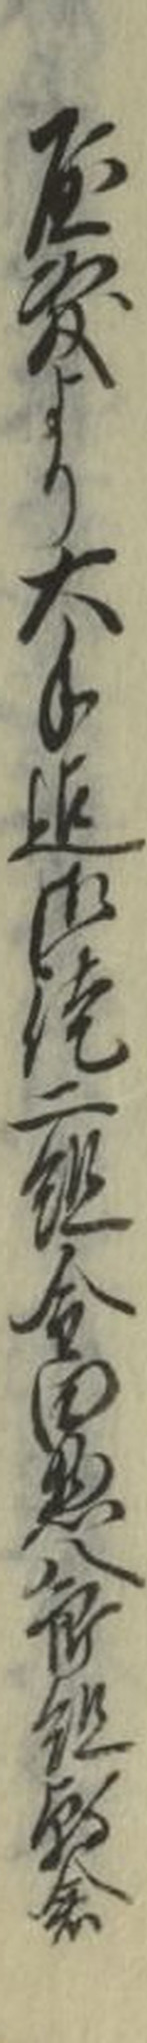屋敷より大手迄御徒二組金田惣八郎組朝倉
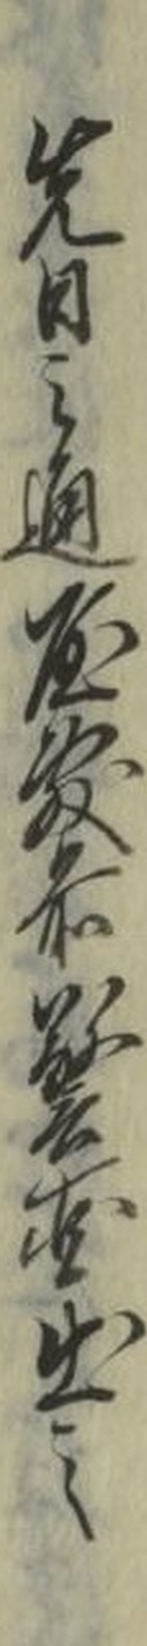先日之通屋敷前警固出之

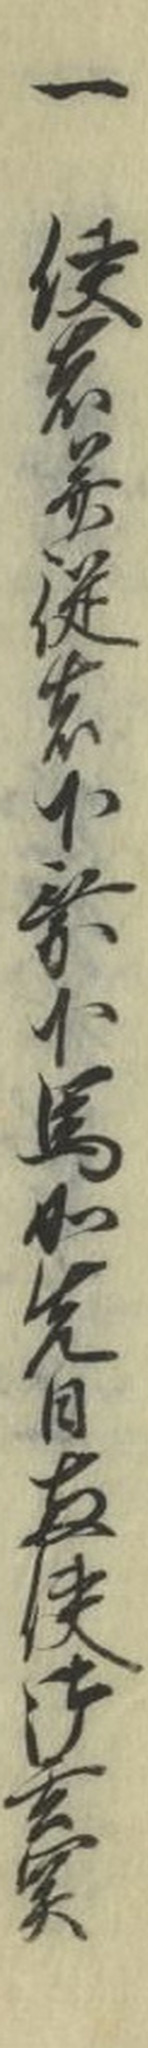一使者并従者下乗下馬如先日両使御玄関
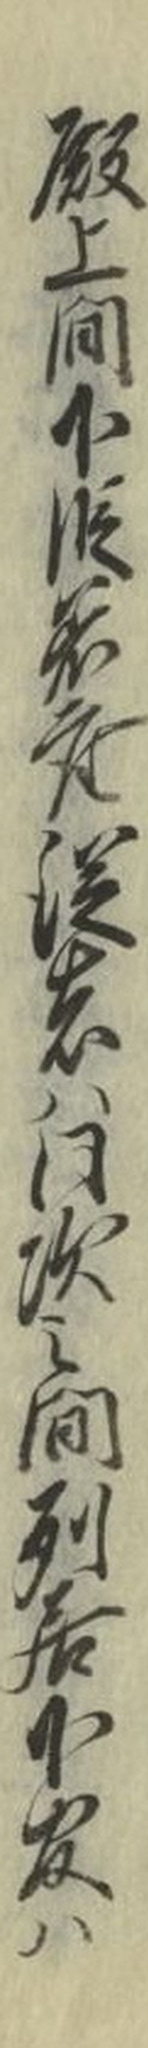殿上間下段着座従者は同次之間列居下官は
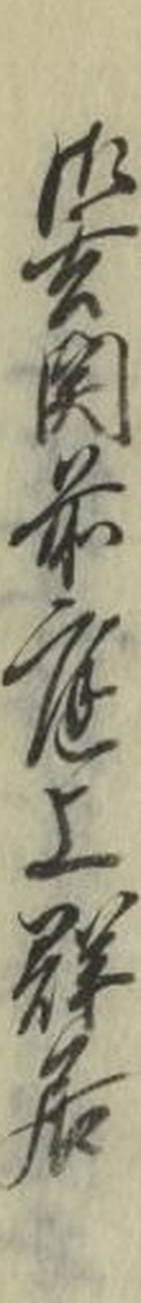御玄関前庭上群居
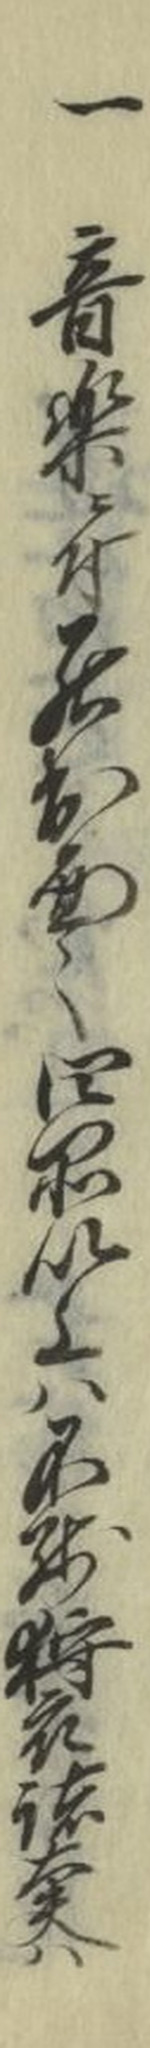一音楽に付罷出面々四品以上は不残狩衣諸大夫は
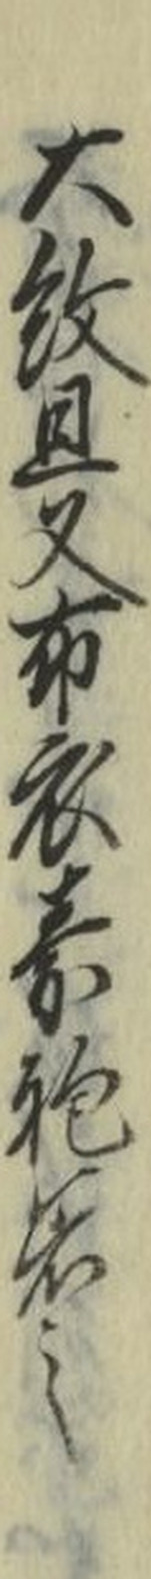大紋且又布衣素袍着之
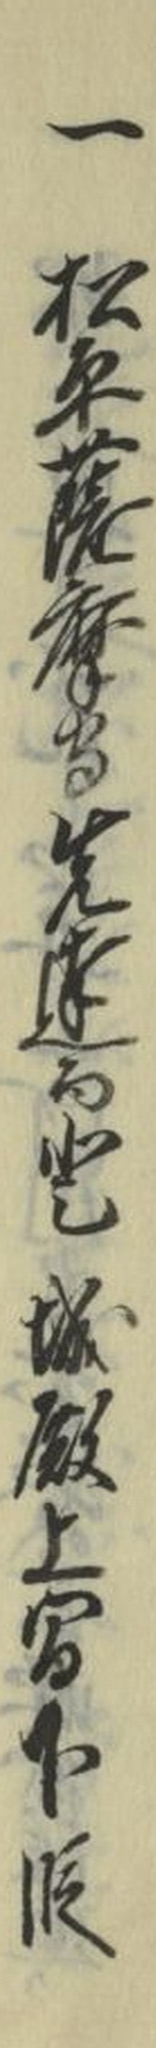一松平薩摩守先達而登城殿上間下段
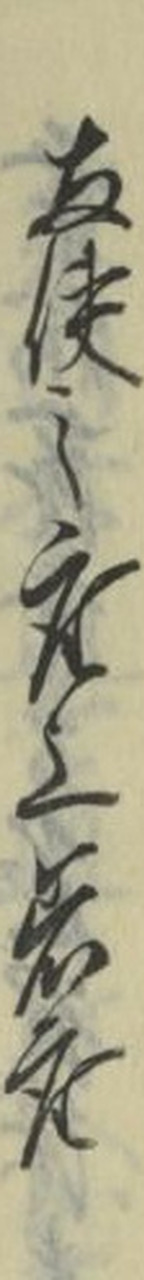両使之座上着座
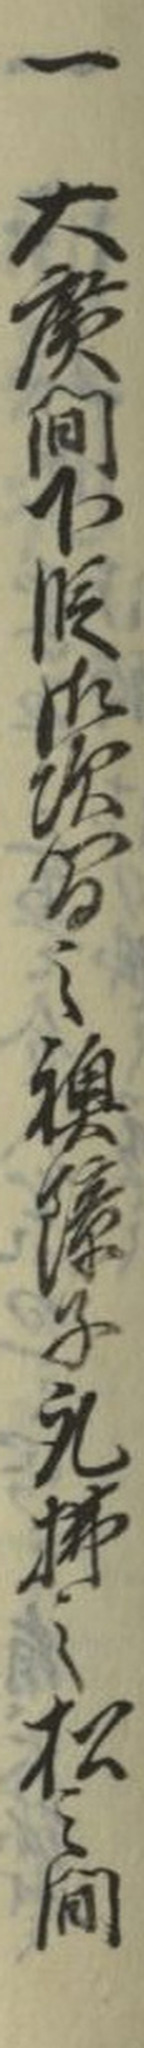一大広間下段御次間之襖障子取払之松之間
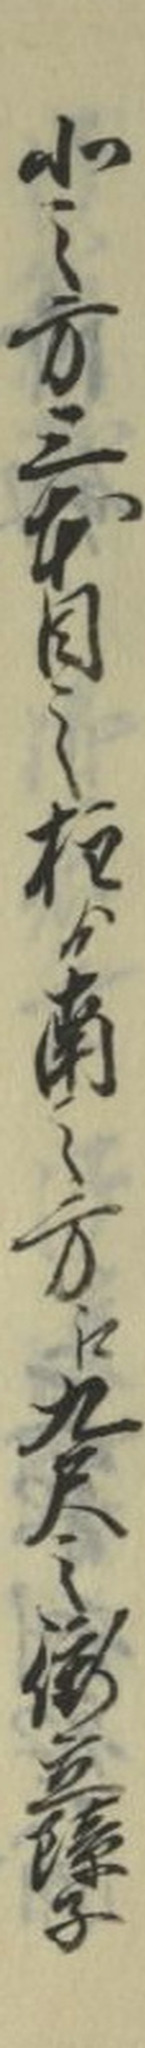北之方三本目之柱ゟ南之方え九尺之衝立障子
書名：琉球人参府記
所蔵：University of the Ryukyus Library
